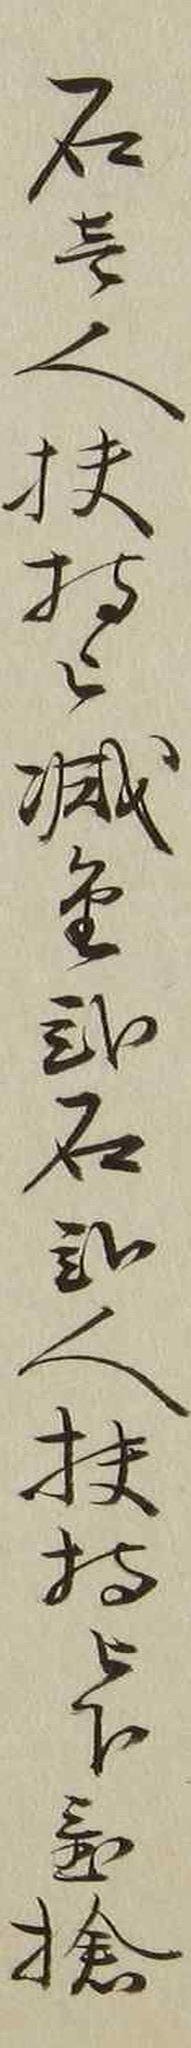石壱人扶持被減金弐石弐人扶持被下置槍
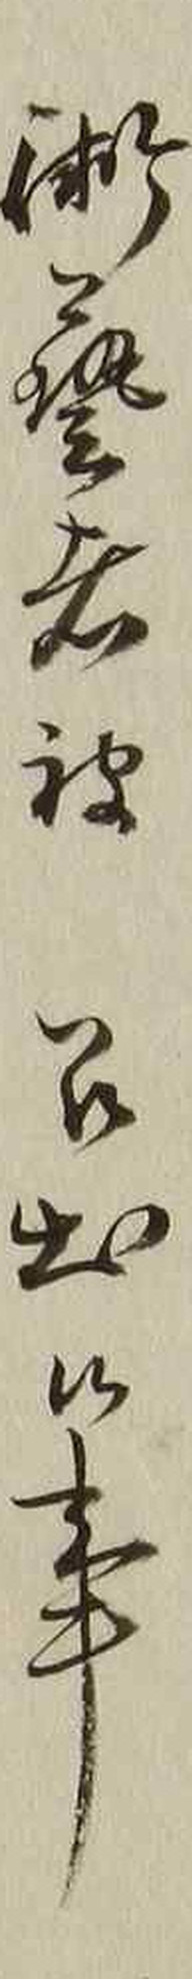術芸者被召出候事
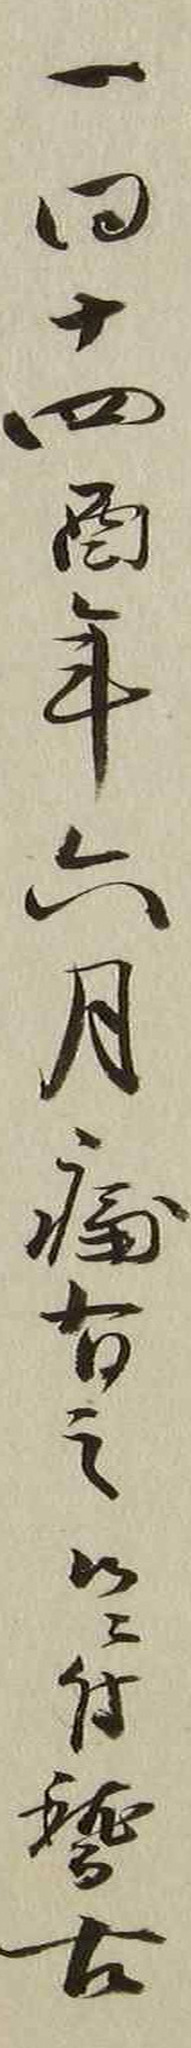一同十四酉年六月痛有之候に付稽古
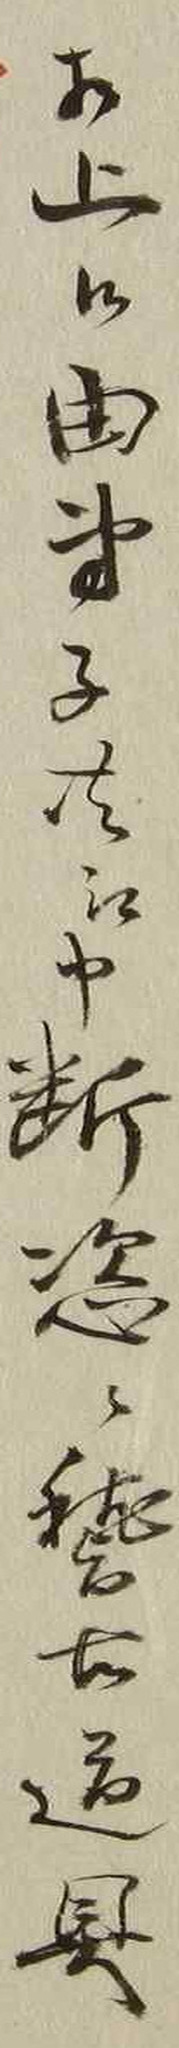相止候由弟子共え申断恣に稽古道具
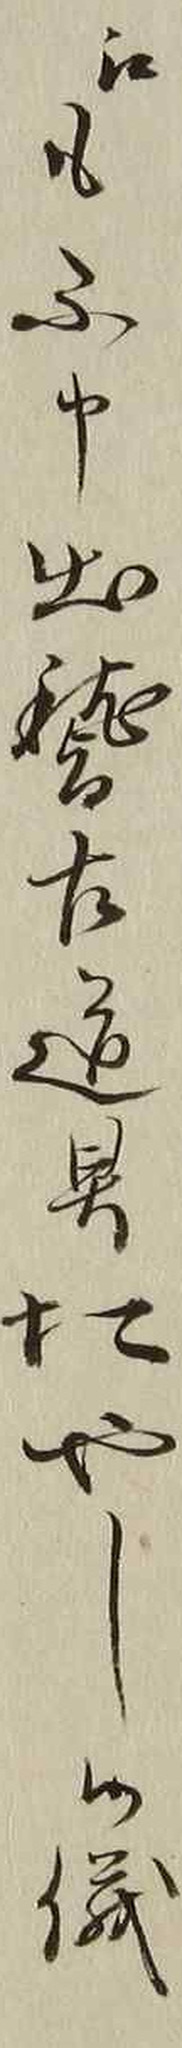えも不申出稽古道具たやし候儀
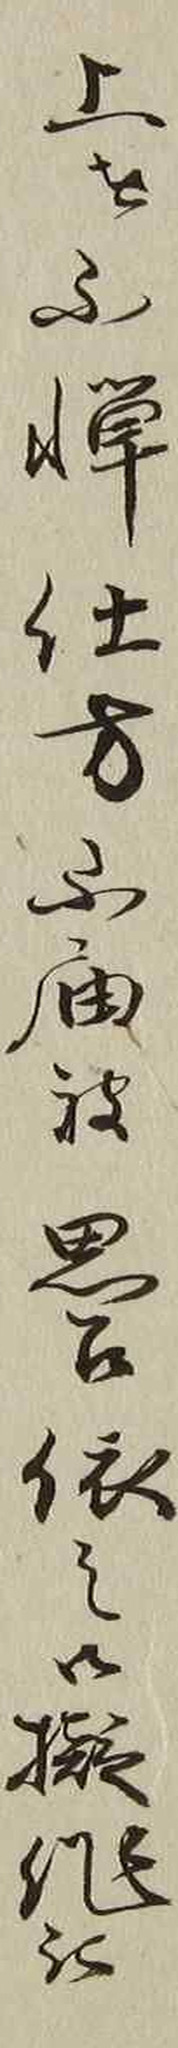上を不憚仕方不届被思召依之御擬作被
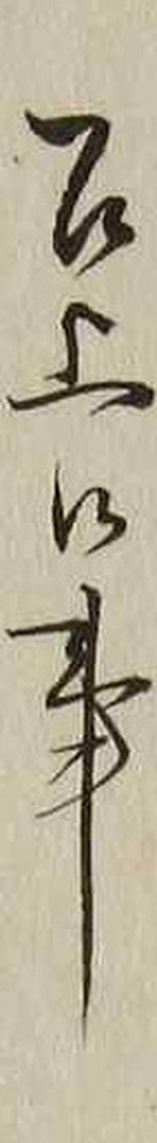召上候事
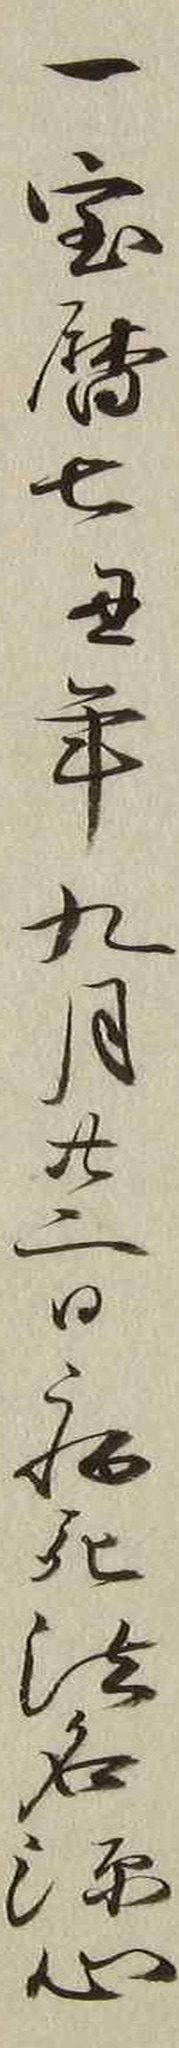一宝暦七丑年九月廿二日病死法名源心
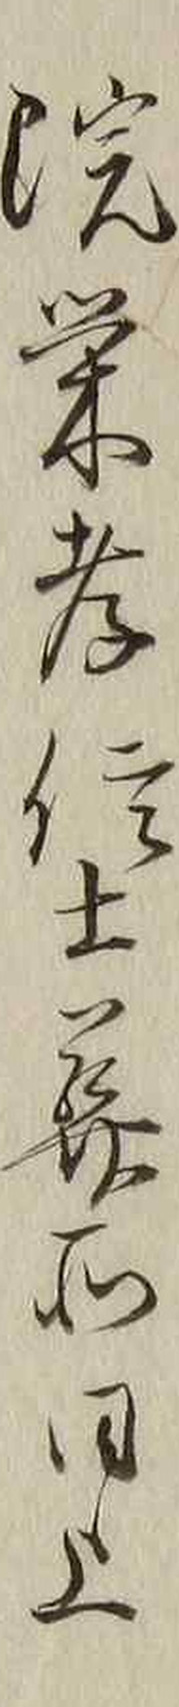院栄孝信士葬所同上
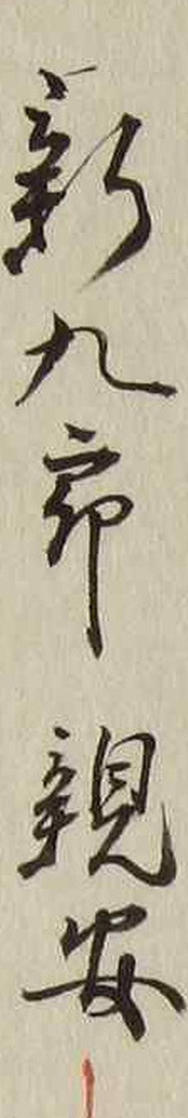新九郎親安
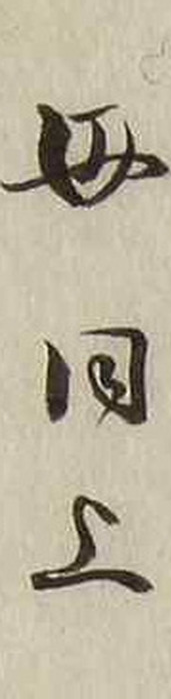母同上
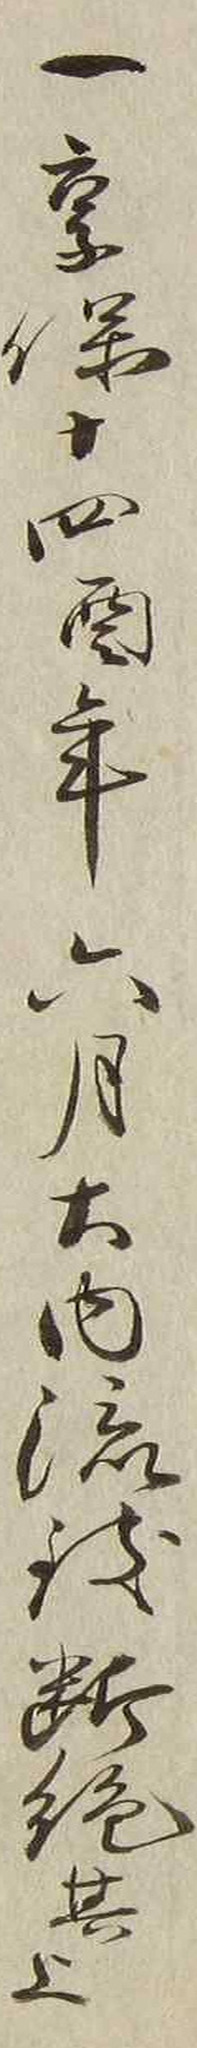一享保十四酉年六月大内流致断絶其上
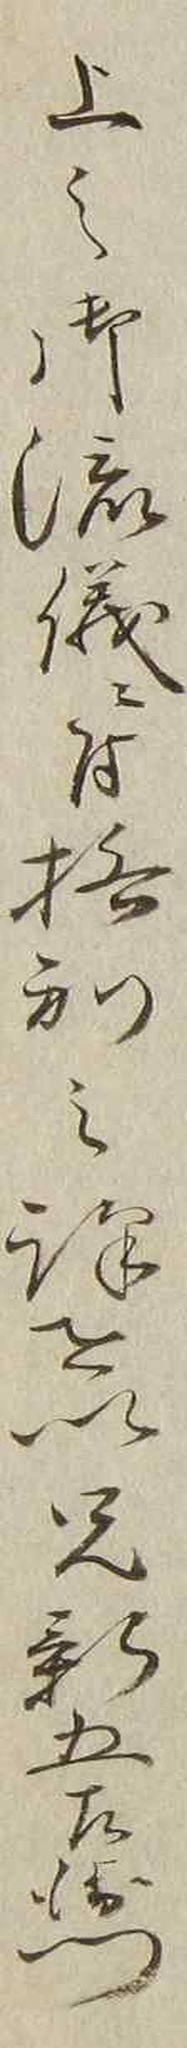上之御流儀に付格別之訳を以兄新五左衛門

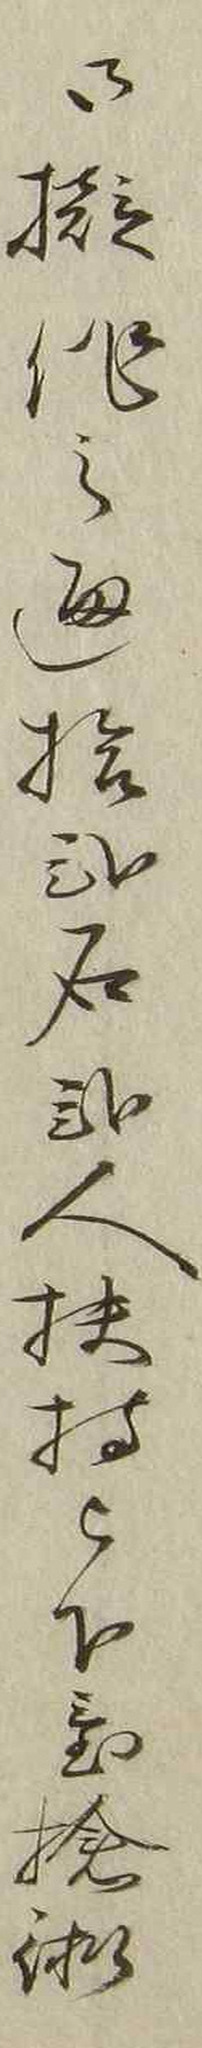御擬作之通拾弐石弐人扶持被下置槍術
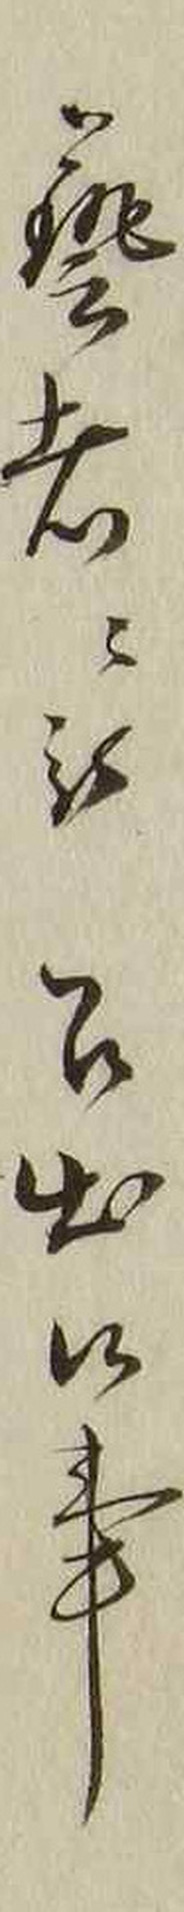芸者に被召出候事
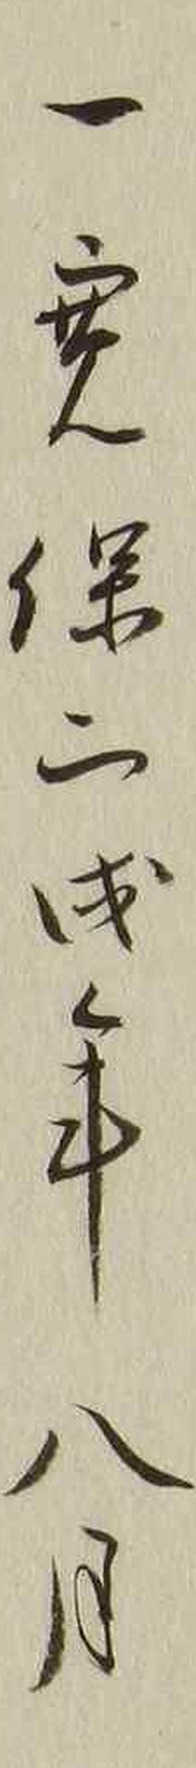一寛保二戌年八月
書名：諸士系譜　巻之157　ね之部1
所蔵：会津若松市立会津図書館
